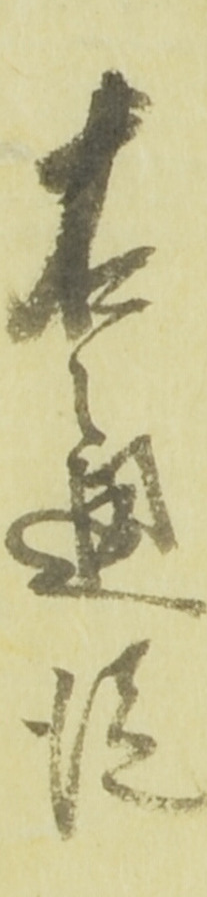右之通従
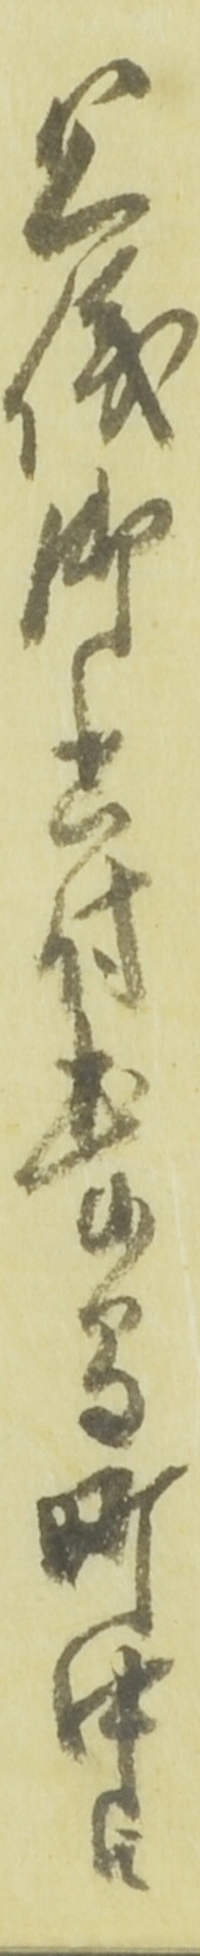公儀御書付出候間町中江
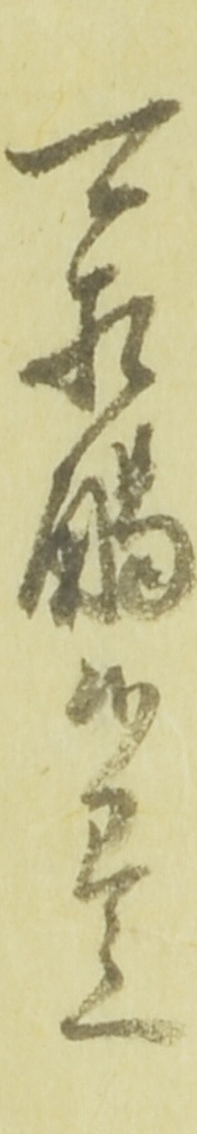可相触候已上
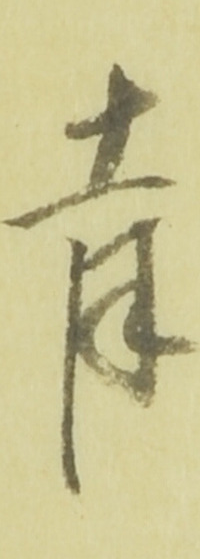十一月
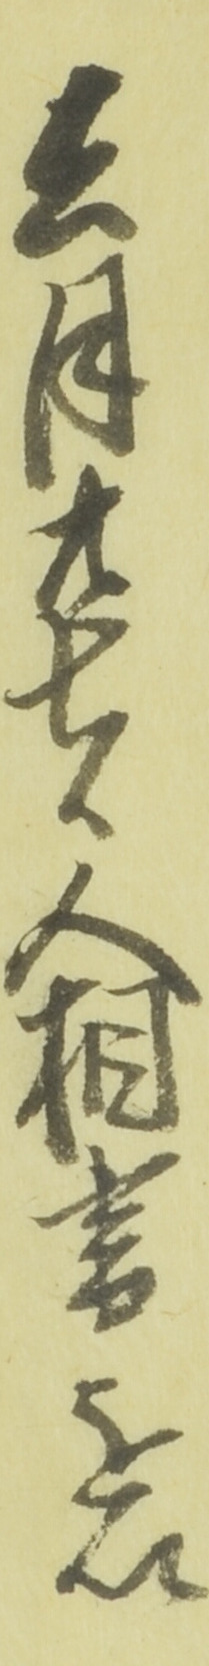去月廿七日人相書を以
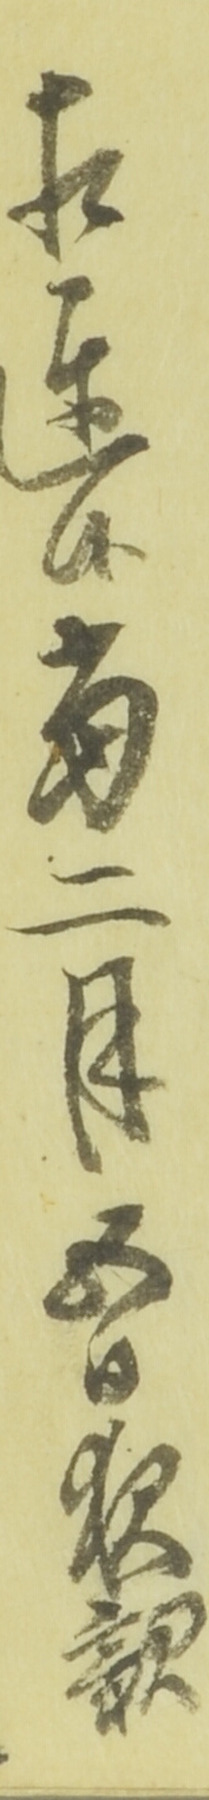相達候当二月五日狂歌
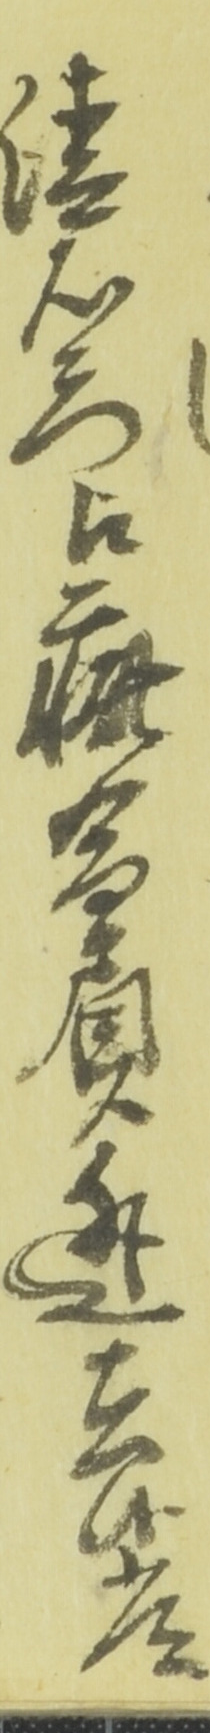清右衛門江疵為負逃去候常
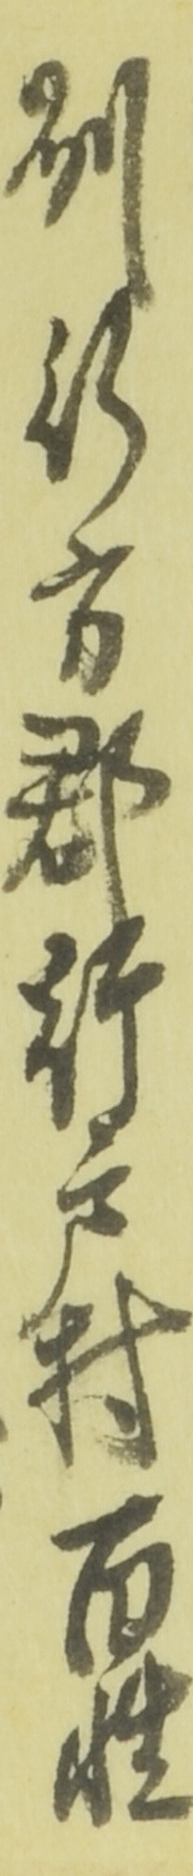州行方郡行戸村百姓
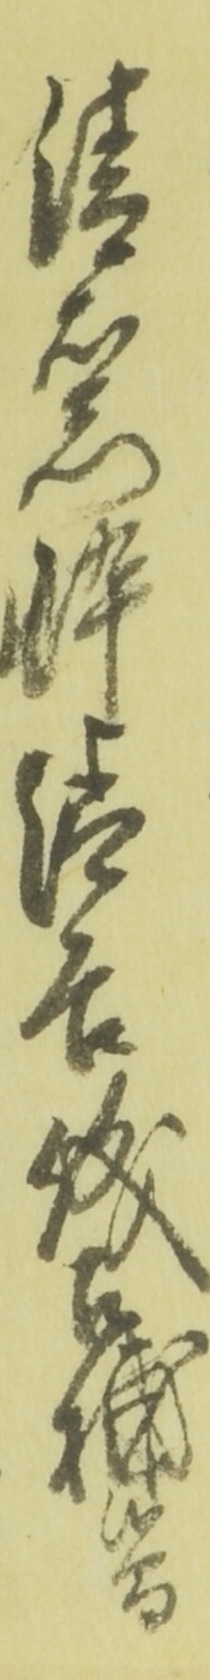清右衛門忰吉儀召捕候間
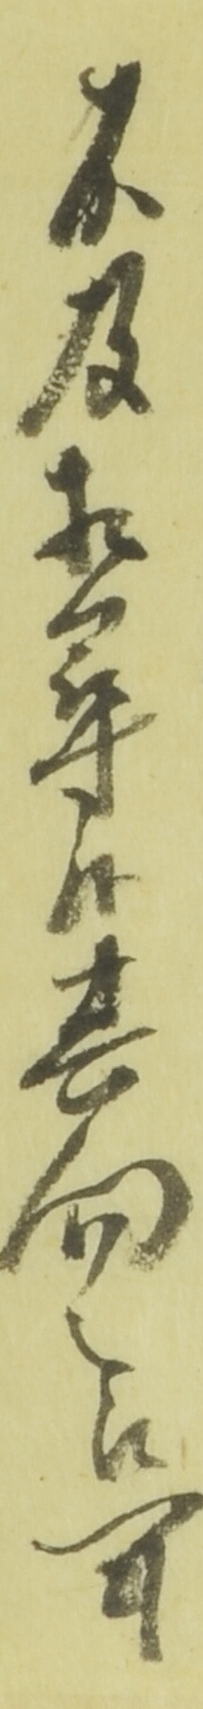不及相尋候其向ニ付可
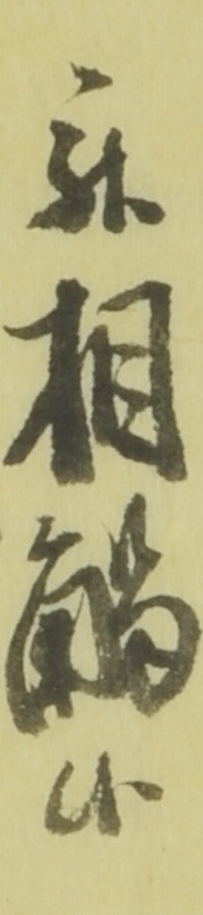被相触候
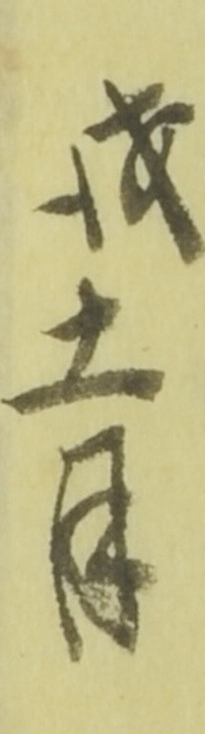戌十一月

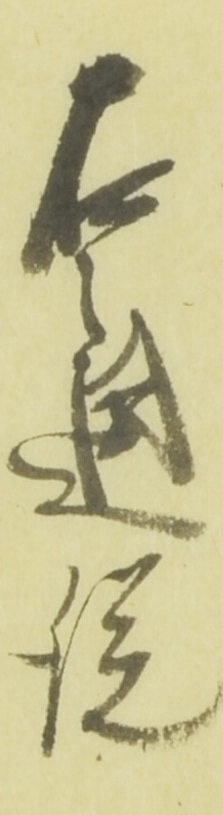右之通従
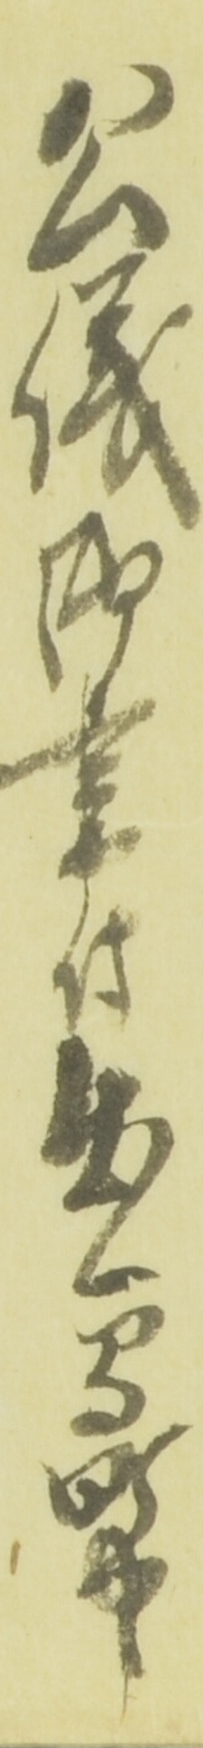公儀御書付出候間町中
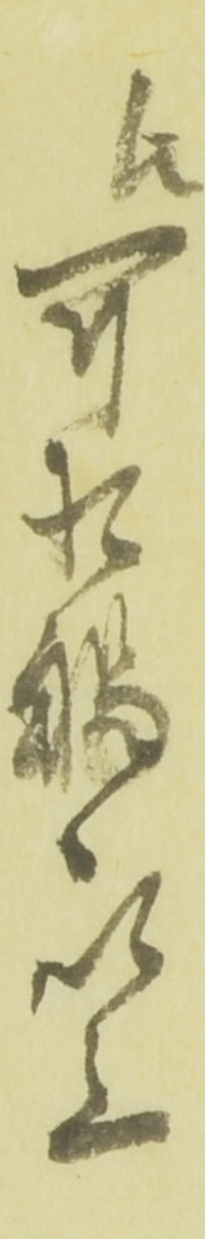江可相触候已上
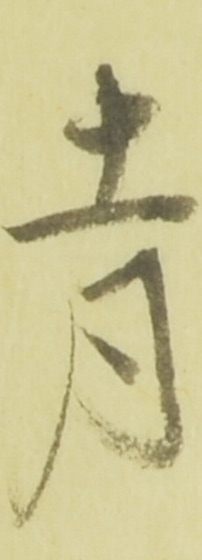十一月
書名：御触書御書附控
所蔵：伊那市立高遠町図書館・合同会社AMANE
